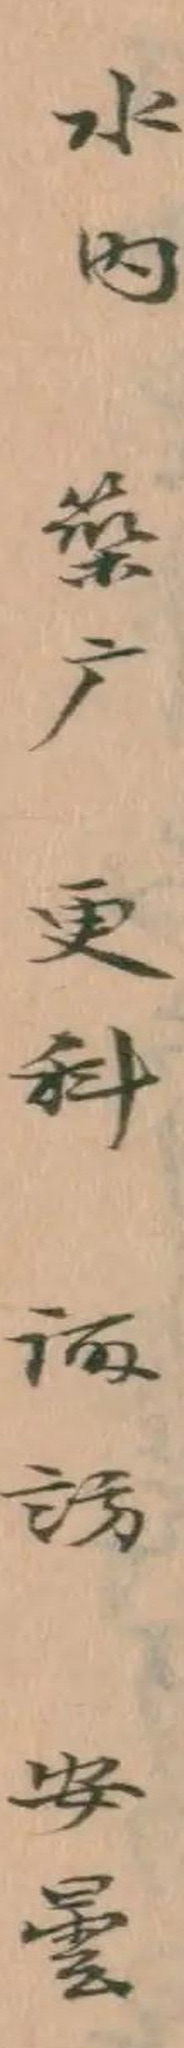水内筑摩更科諏訪安曇
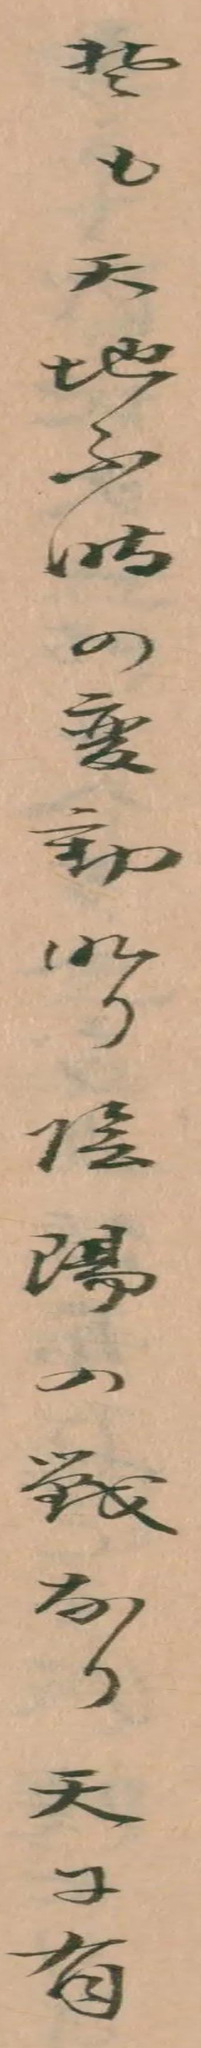そも天地不時の変動なり陰陽の戦なり天に有
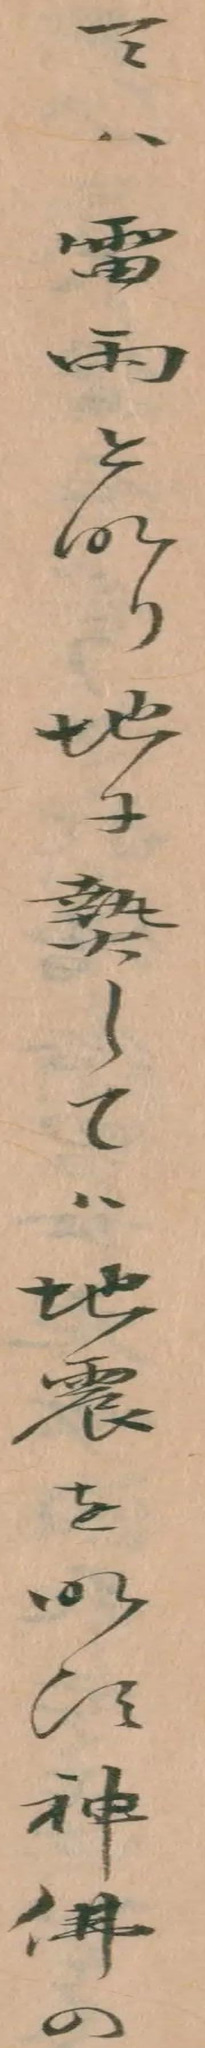てハ雷雨となり地に蟄してハ地震を明す神仏の
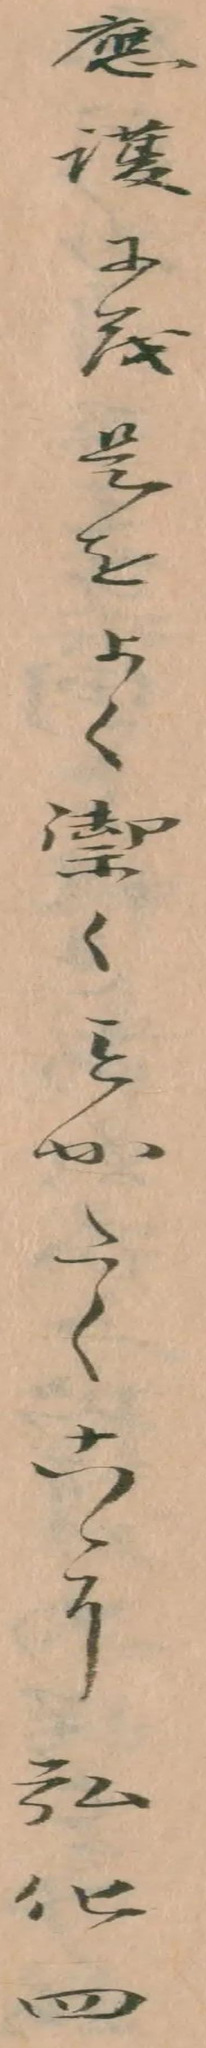應護にもこれをよく禦くことかたくこゝに弘化四
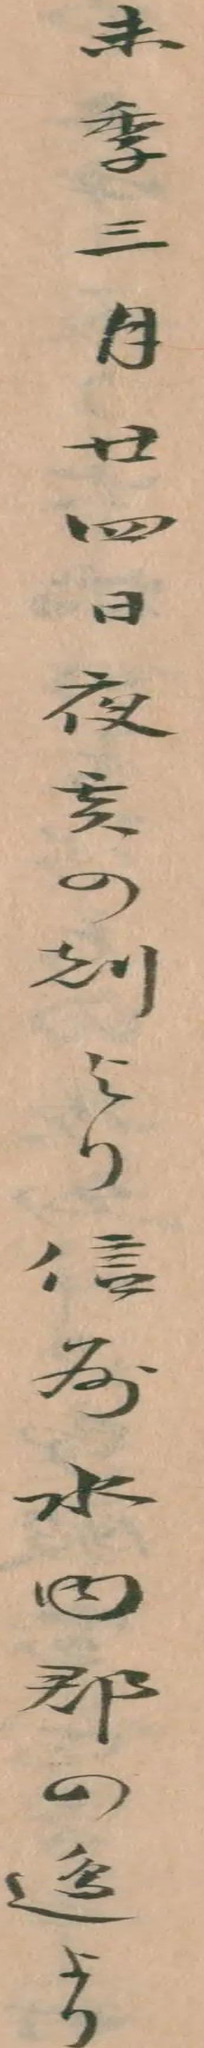未季三月廿四日夜亥の刻より信州水内郡の辺より
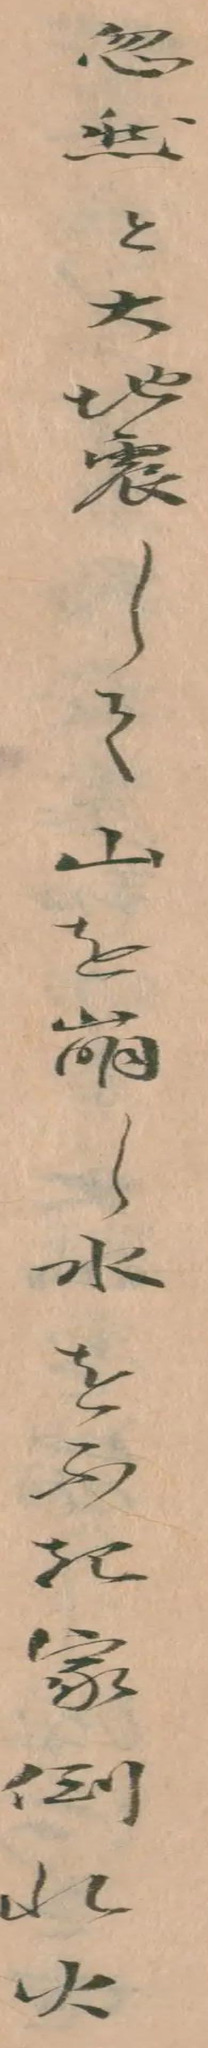忽然と大地震して山崩し水をふき家倒れ火
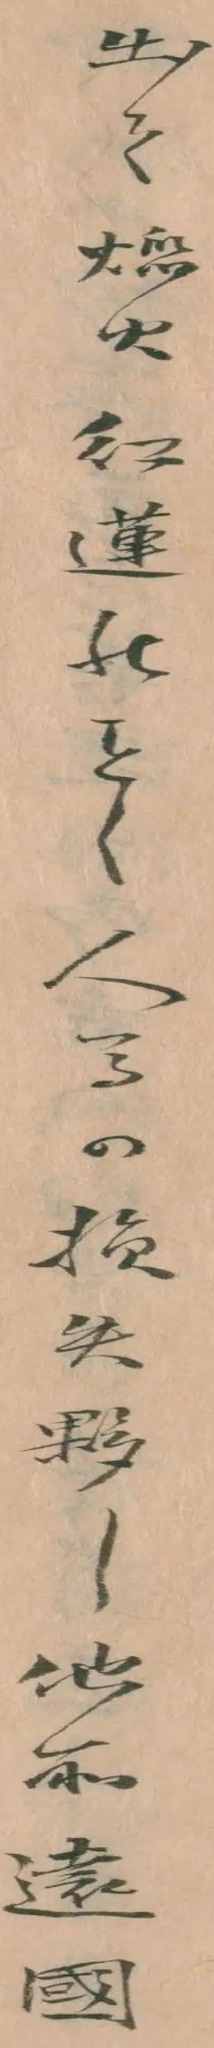出て焔火紅蓮のことく人馬の損失夥し他所遠国
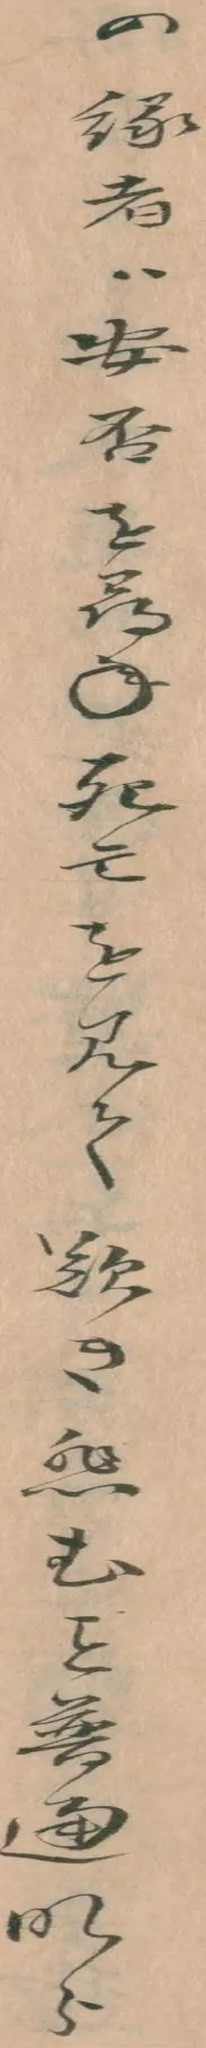の縁者ハ安否を尋ね死亡を見て嘆き憐むこと普通なら
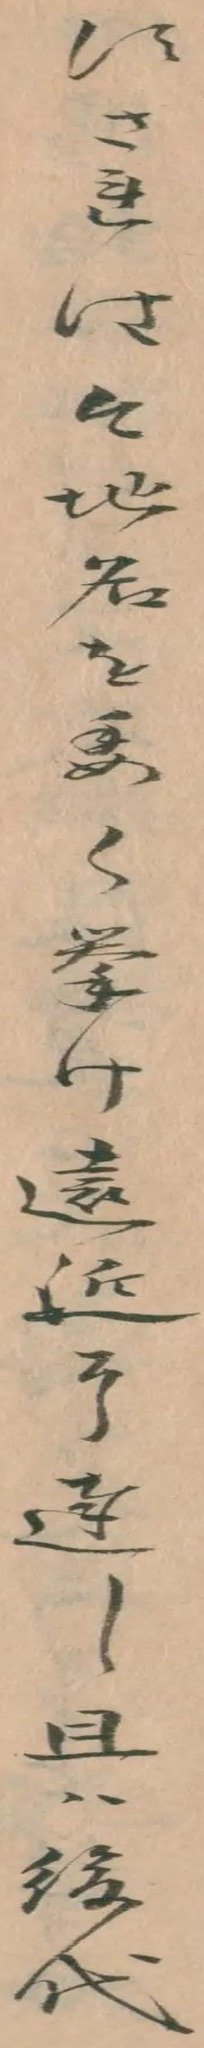すされは今地名を悉く挙け遠近に達し且は後代

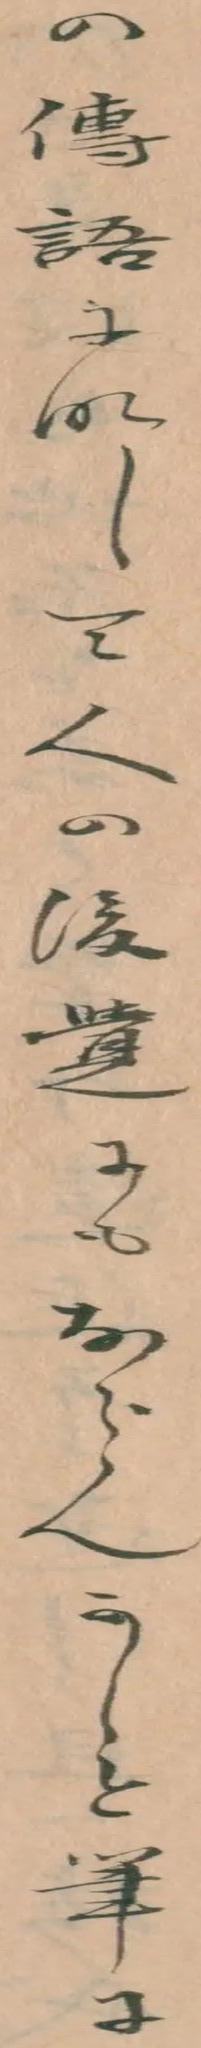の伝語になして人の後覚にもならんかと筆に
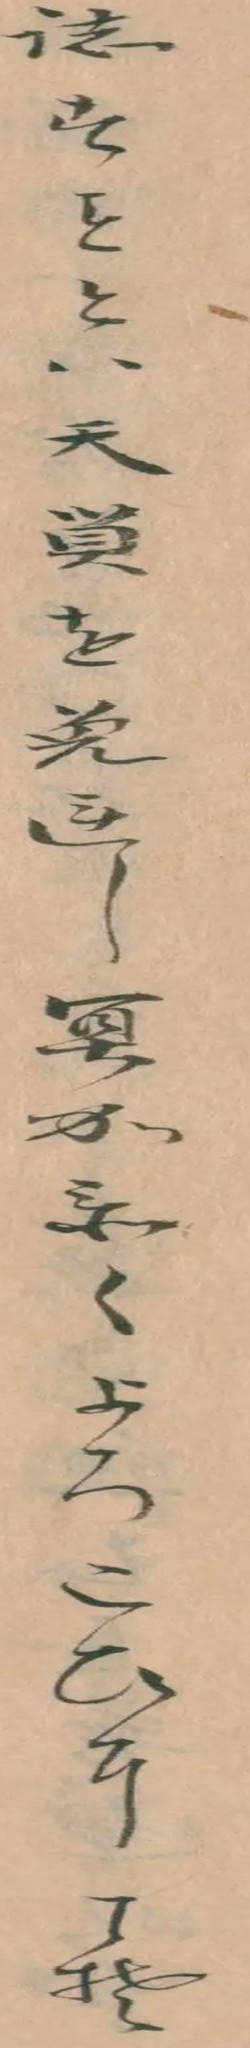誌すこととハ天災を免れし冥加悉くよろこひにこそ
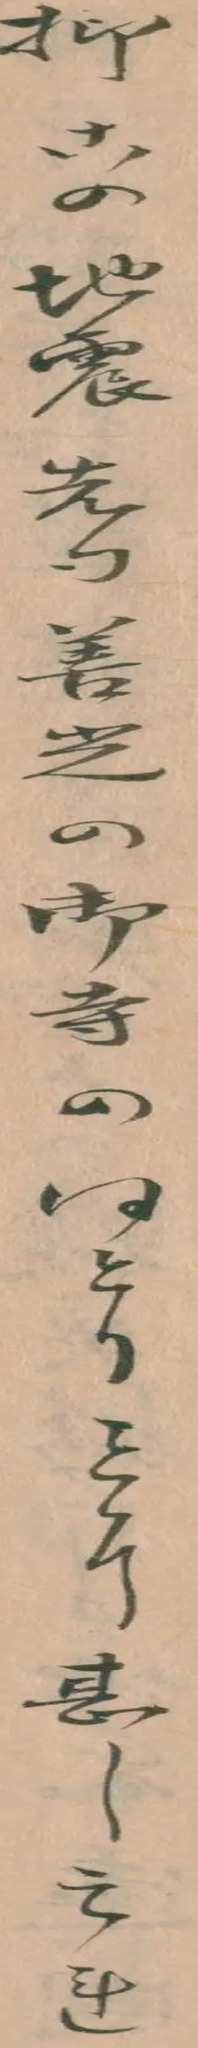抑此地震先の善光寺の御寺のほとりことに甚しそれ
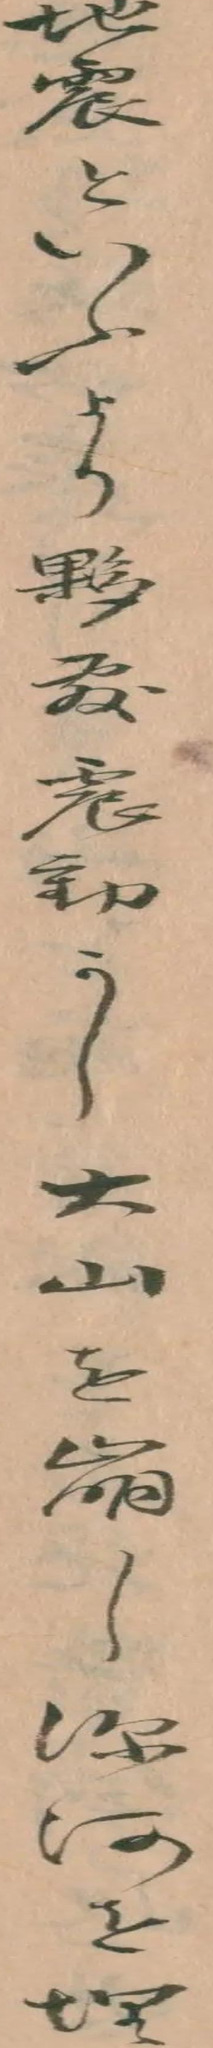地しんといふより夥敷震動し大山を崩し深河を埋
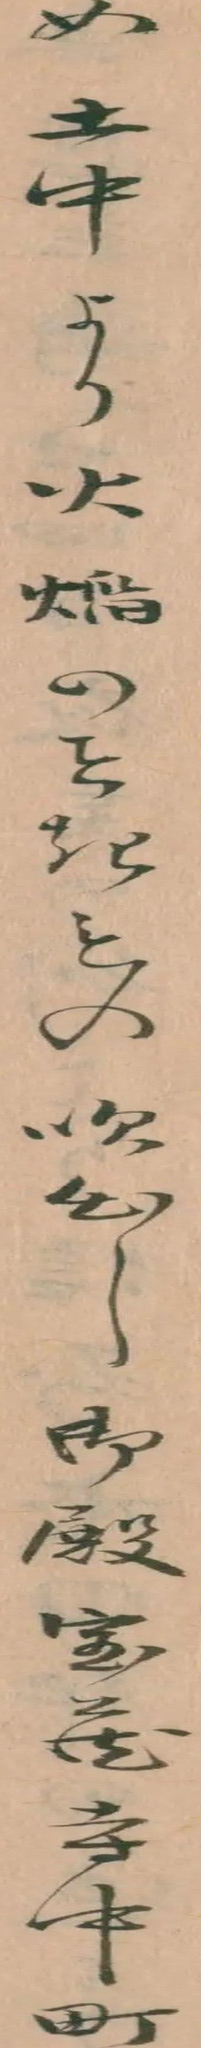め土中より火焔のこときもの吹出し御殿宝蔵寺中町
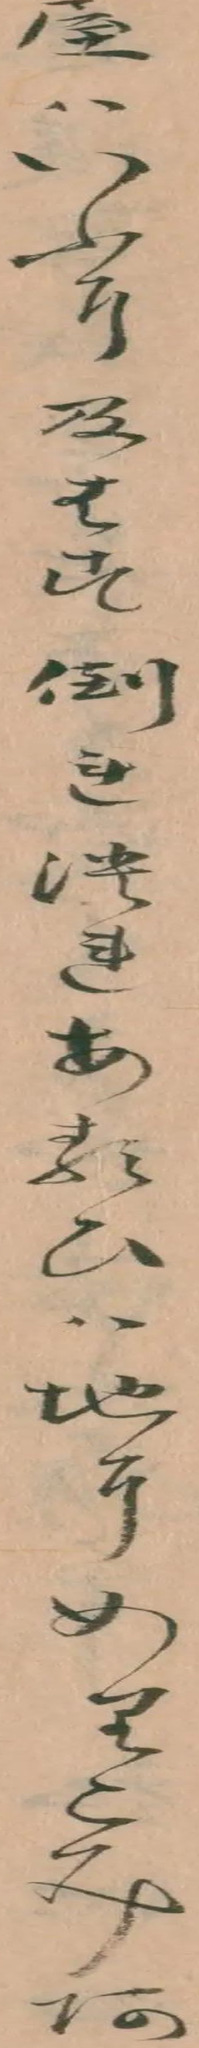屋ハいふに及はす倒れ潰れあるひハ地にめりこみあ
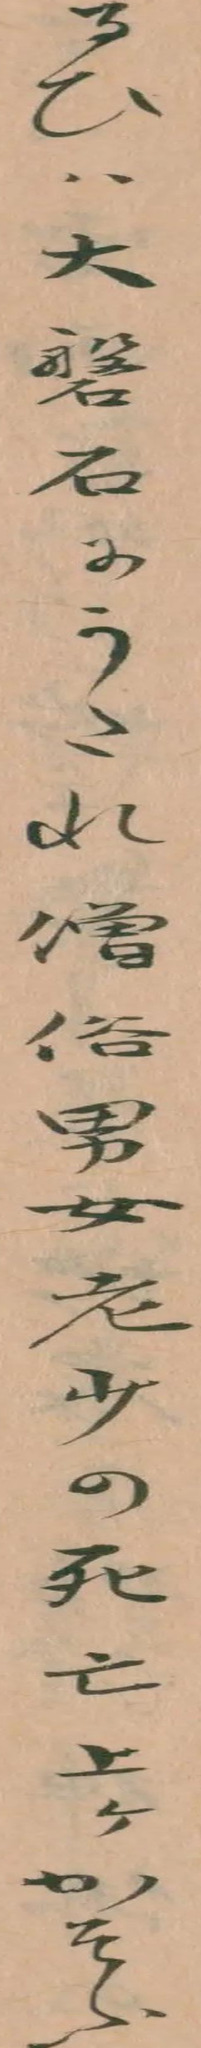るひハ大磐石にうたれ僧俗男女老少の死上ヶかぞふ
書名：地災撮要. 巻3(地震之部)-巻4(噴火之部)
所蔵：国立国会図書館 National Diet Library, JAPAN
